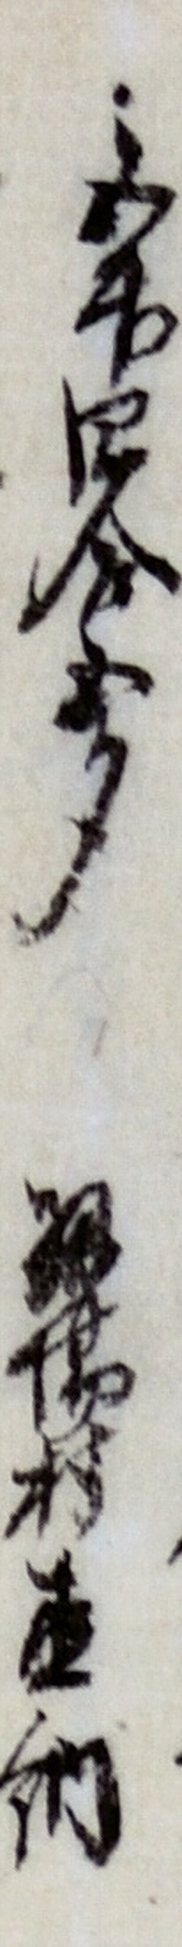・五升四合五勺羽場村直納
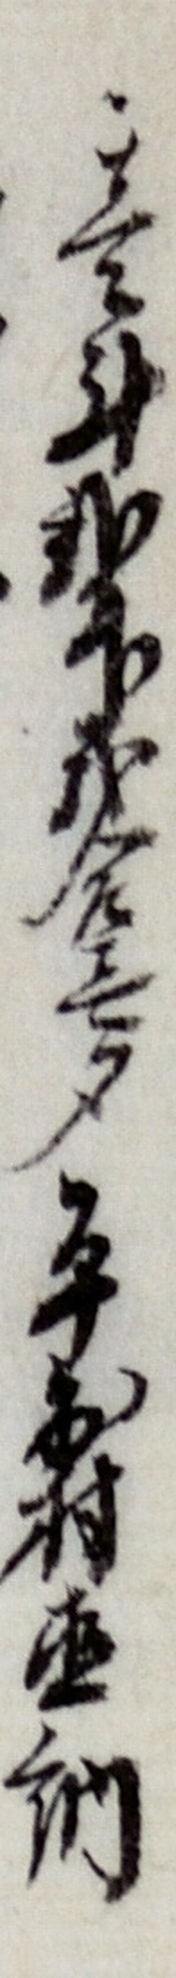・壱斗弐升弐合壱勺平出村直納
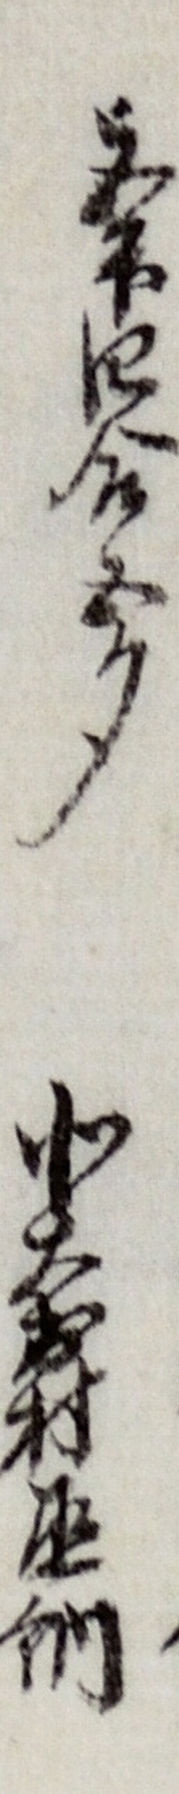・五升四合五勺北大出村直納
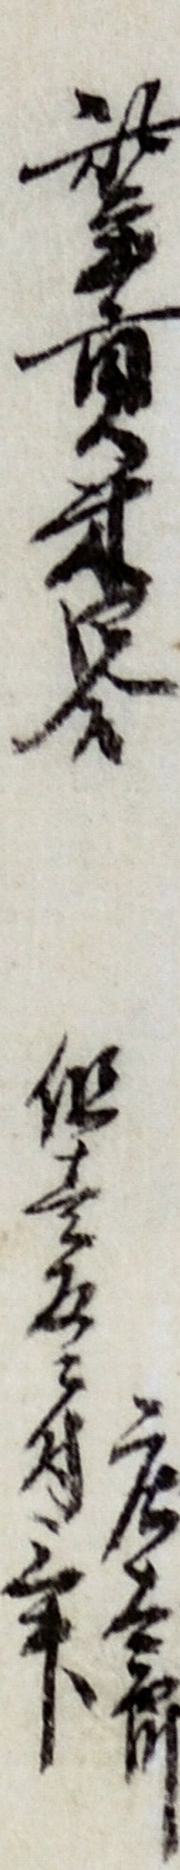此年貢米四合但壱反ニ付三升
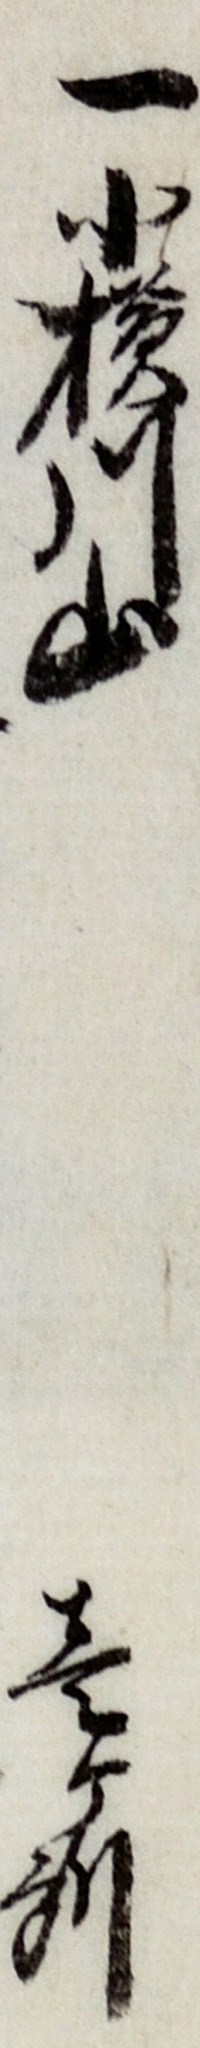一小横川山壱ケ所
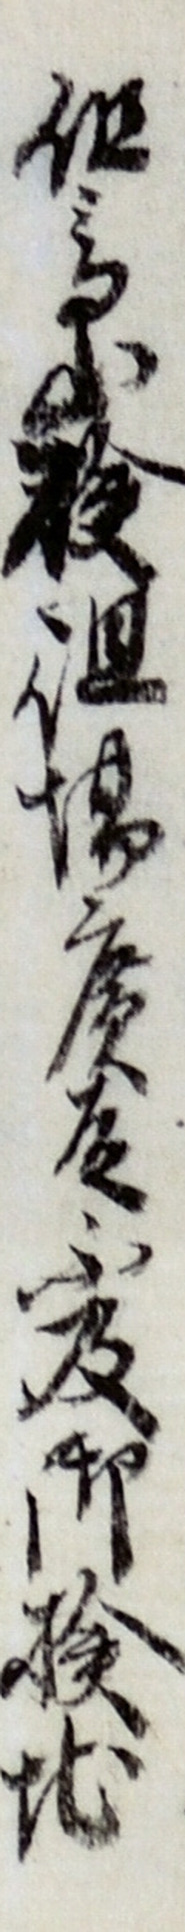但高山嶮岨場広故不及御検地
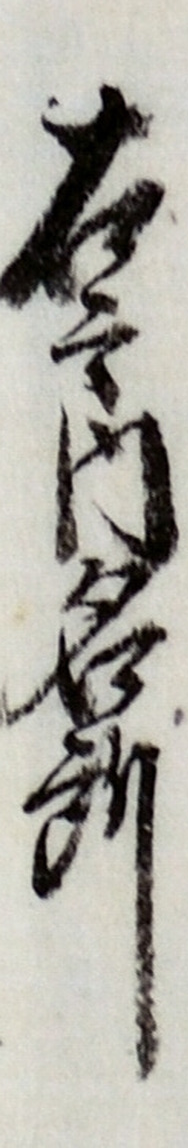右之内名所
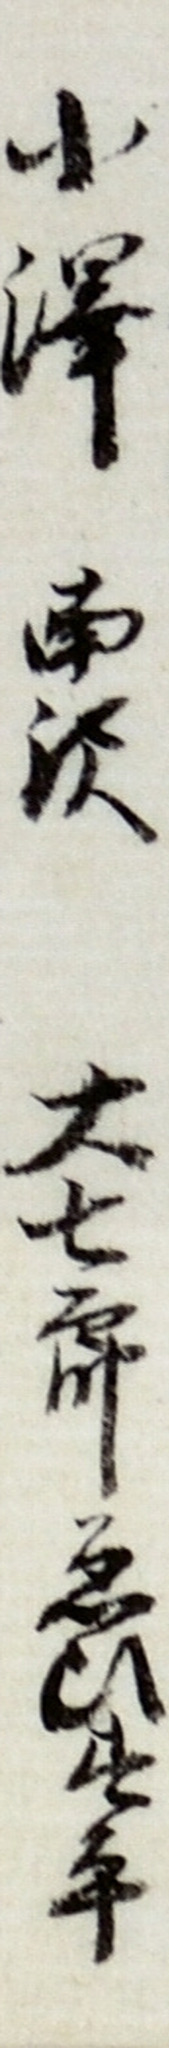小沢南沢大七郎ゑひす平
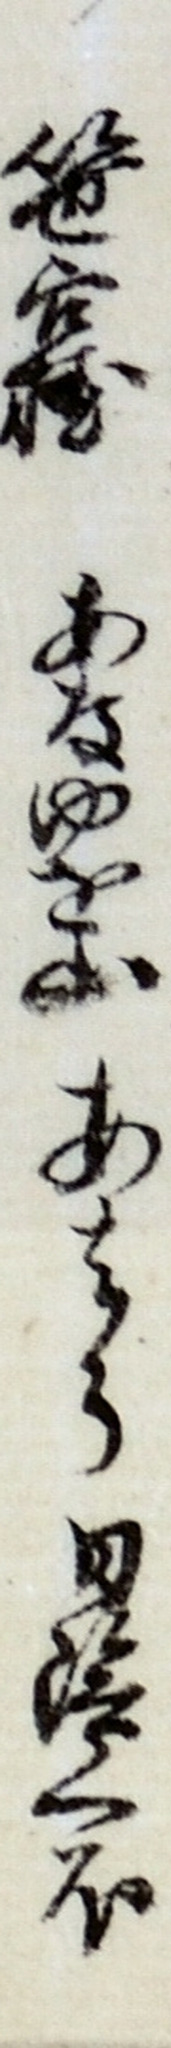笹窪あなゆを山あはう日陰くほ
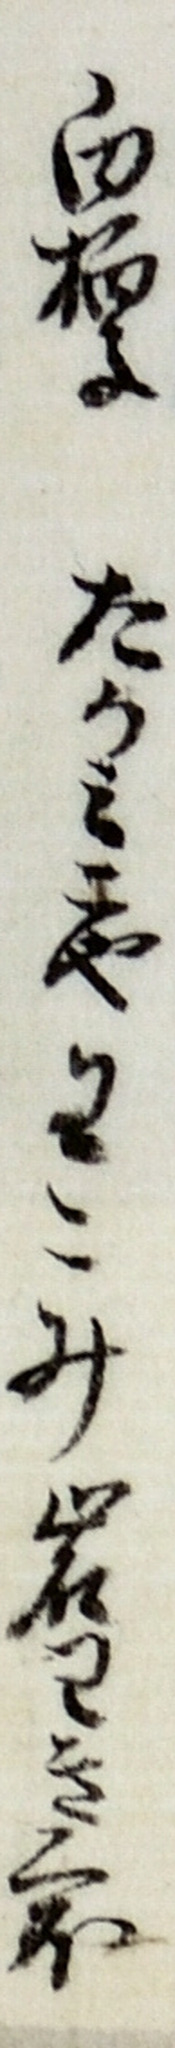白拍子たかみこやわこみ岩わきくほ
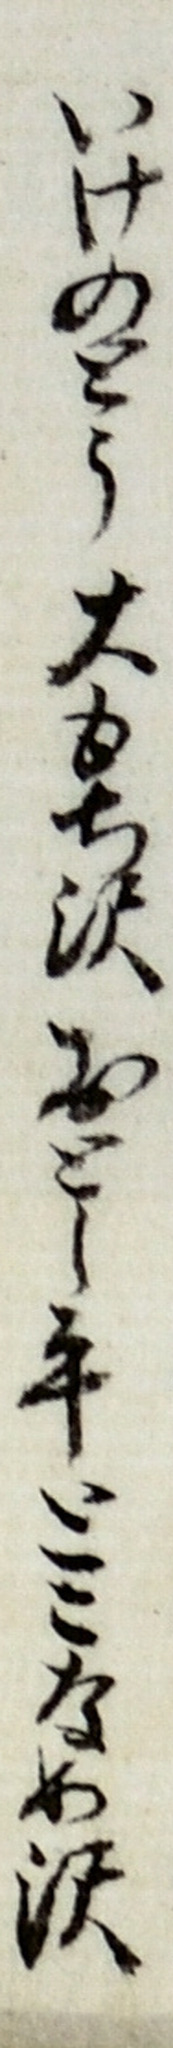いけのとう大もち沢おとし平とこなめ沢
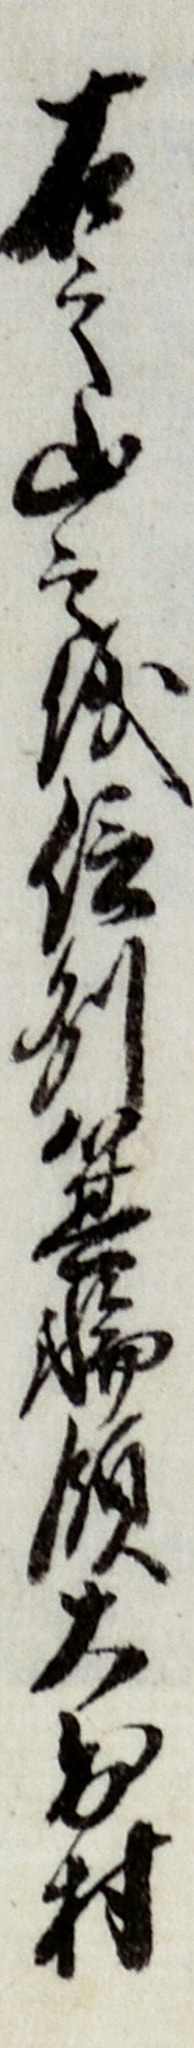右之山之儀信州箕輪領大出村
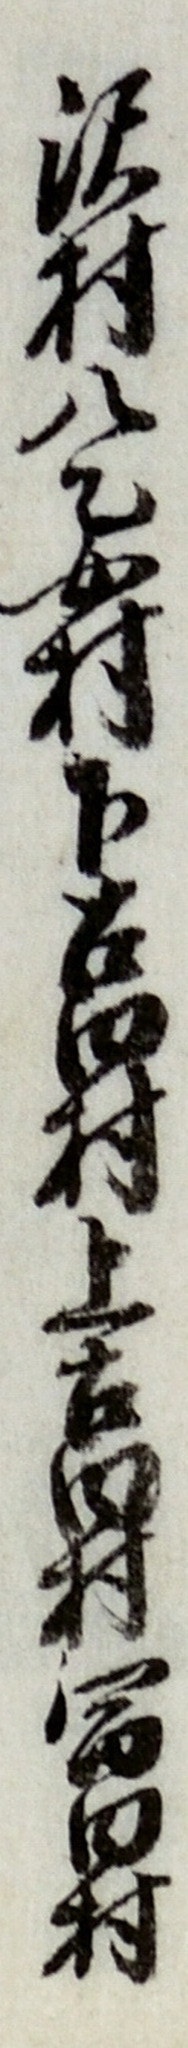沢村八乙女村下古田村上古田村富田村
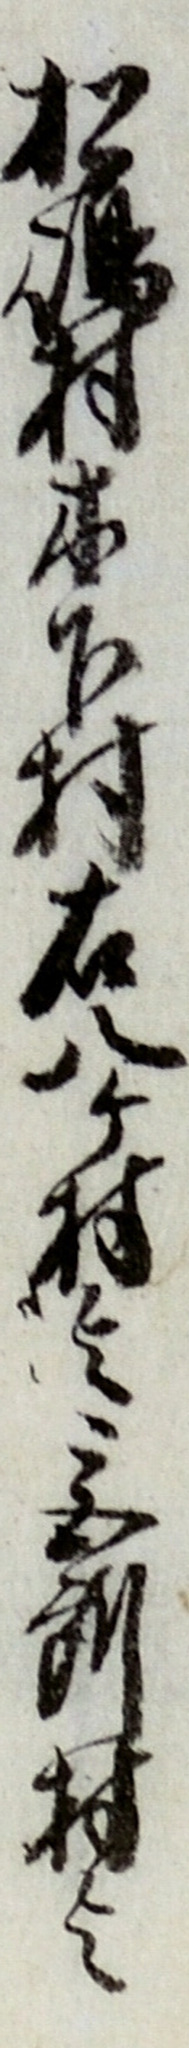松島村木下村右八ケ村と宮所村と
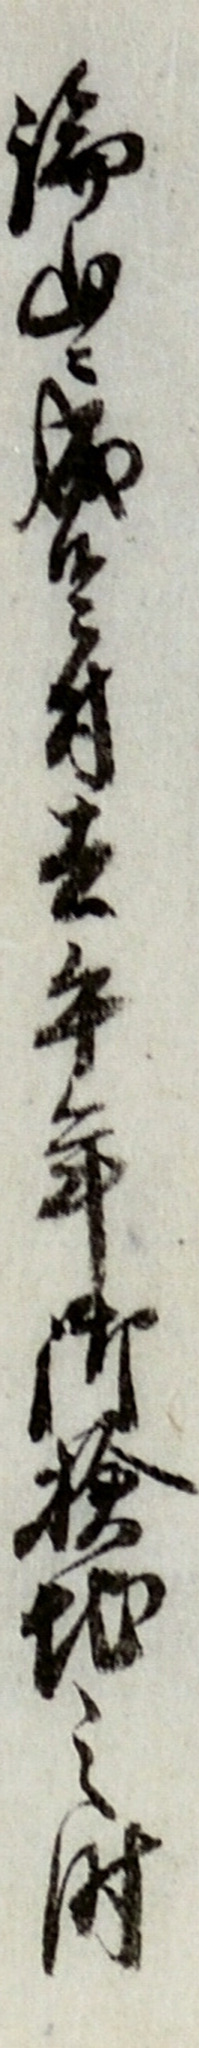論山ニ成候ニ付去午年御検地之時
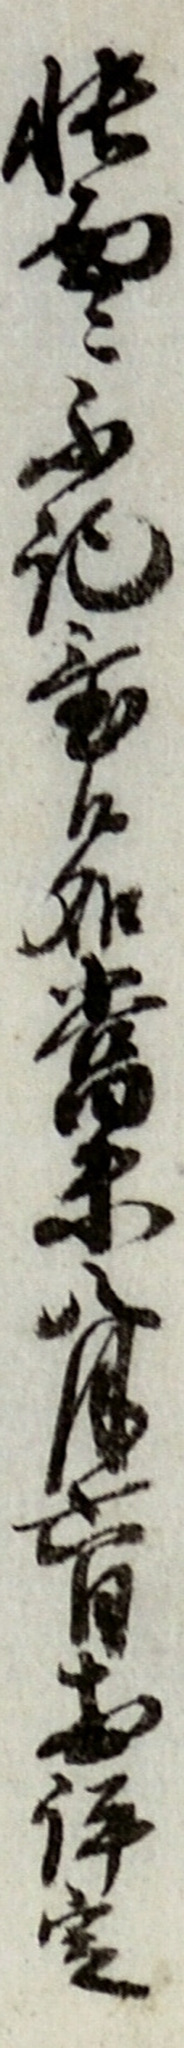帳面ニ不記置候処当未八月六日於評定
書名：御領分中山林社地手控
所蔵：伊那市立高遠町図書館・合同会社AMANE
